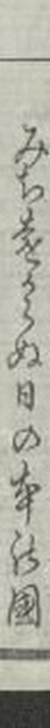みち遠からぬ日の本の国
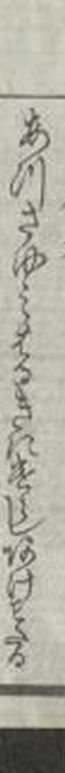あつさゆみはるきにけらしあけみたる
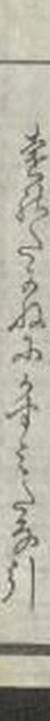遠のたかねにかすみたな引
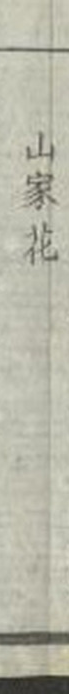山家花
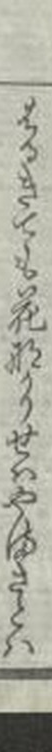はるきても花なかりせはやまさとは
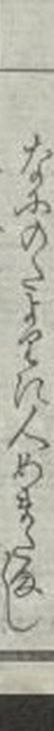なにのたよりに人めまたまし
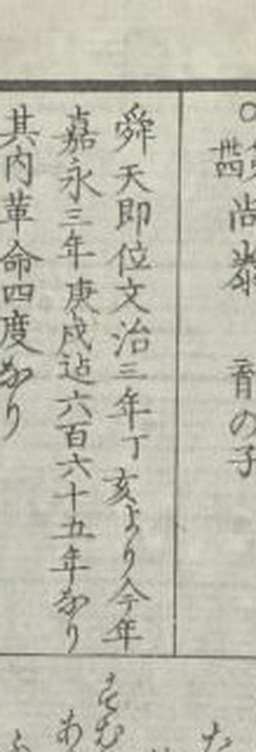舜天即位文治三年丁亥より今年
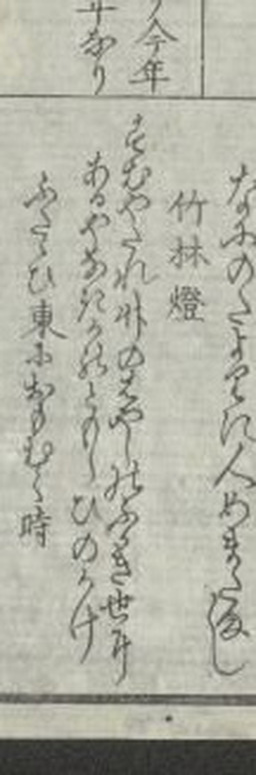すむやたれ竹のはやしのふかき世に
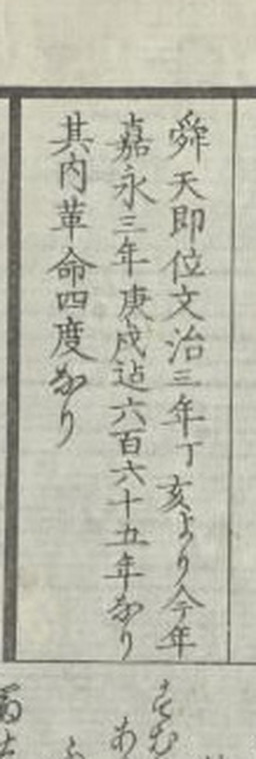嘉永三年庚戌迠六百六十五年なり
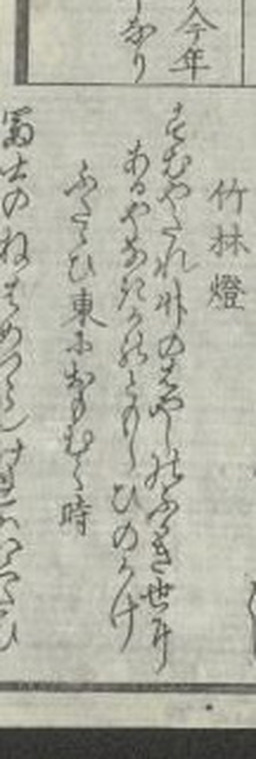あるやなきかのともしひのかけ
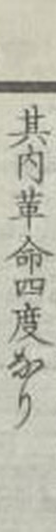其内革命四度なり
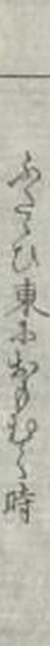ふたゝひ東におもむく時
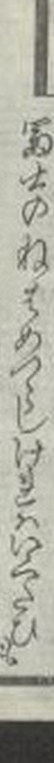冨士のねはめつらしけれはいくたひも
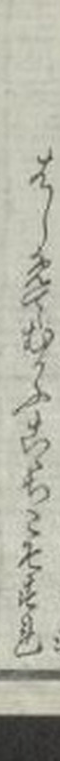はしめてむかふこゝちこそすれ
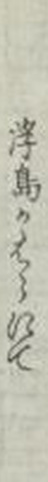浮島かはらにて
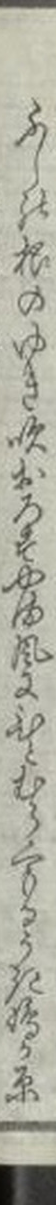ふしの根のゆき吹おろすやま風にふとむらくもるうき嶋か原
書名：中山国使略
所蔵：University of the Ryukyus Library
